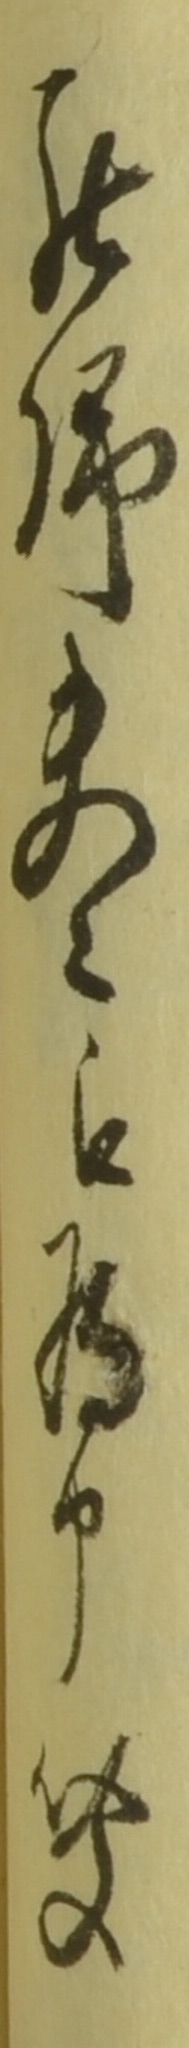罷帰夫々江為申聞
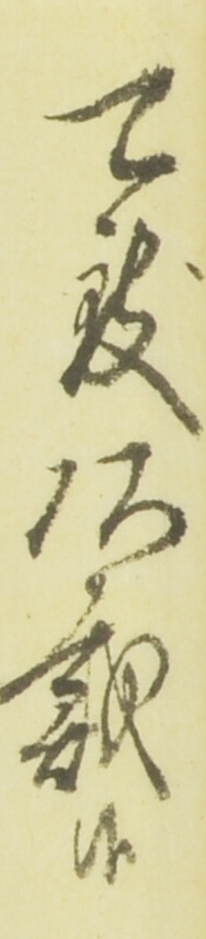可致頂戴候
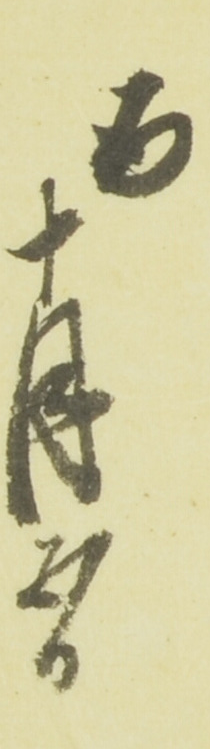十月五日
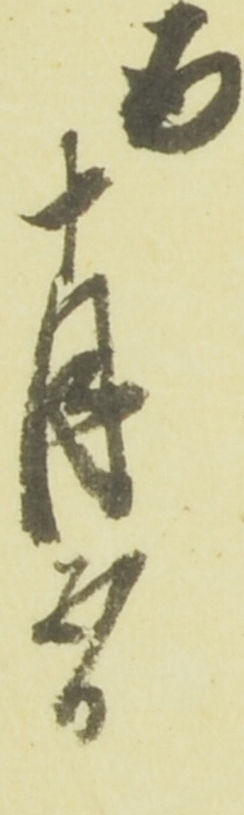十月五日
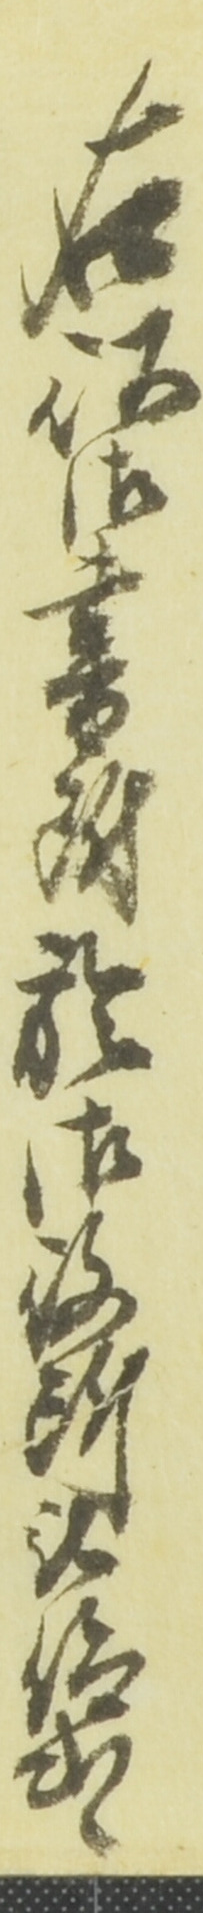右以御書附於御役所被仰出候
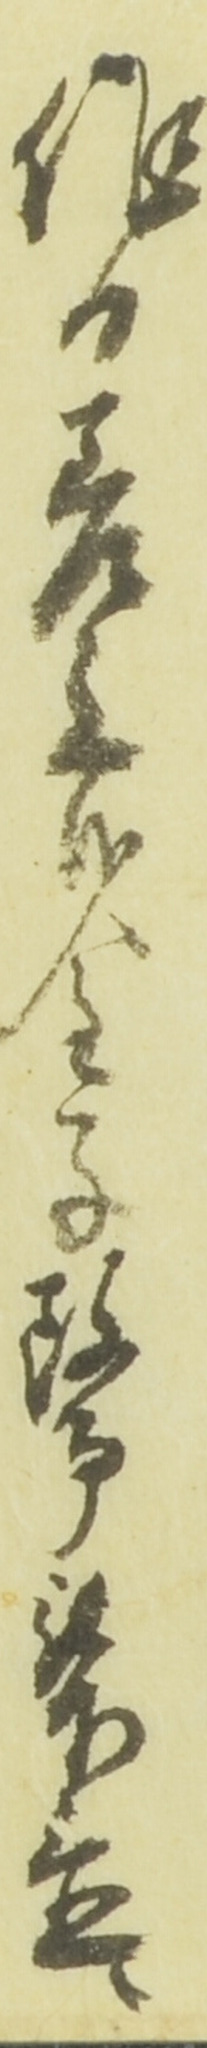昨日差上候金子改而被下置候
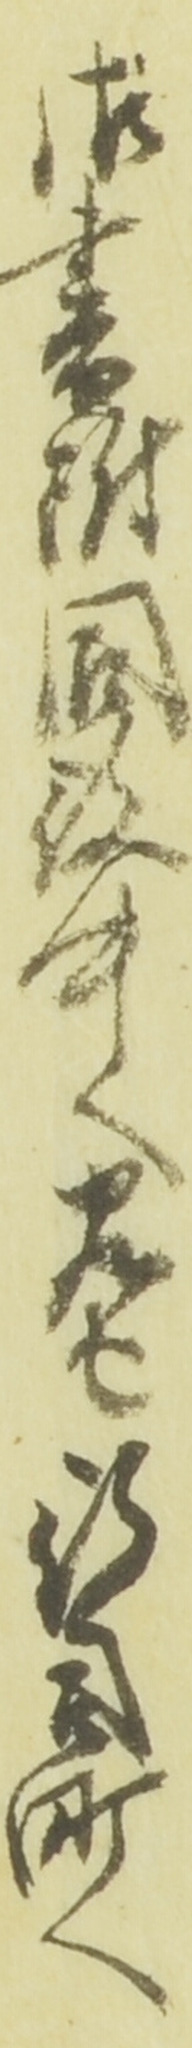御書附同役中へ見せ行司町へ
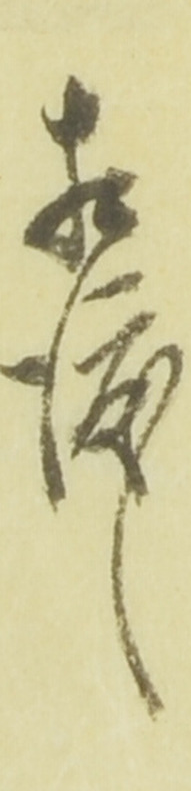相渡候
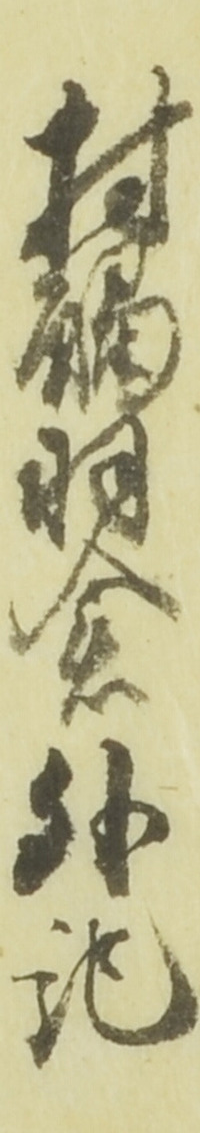村触羽倉外記
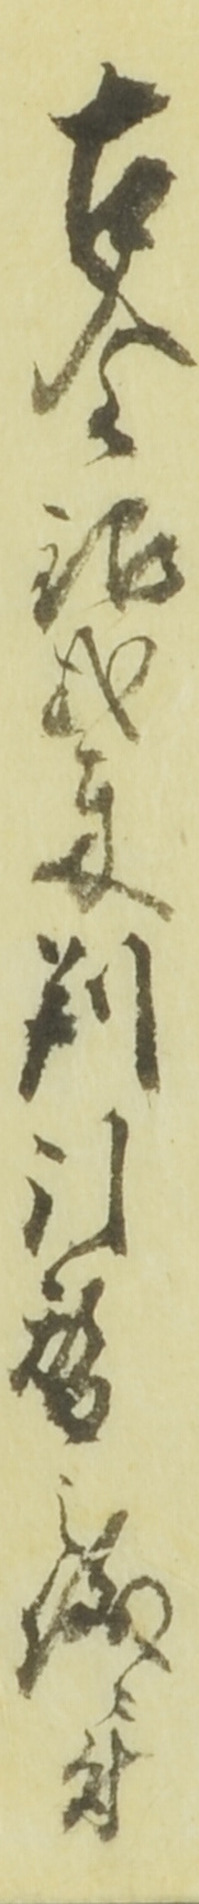古金銀弐朱判引替之儀ニ付
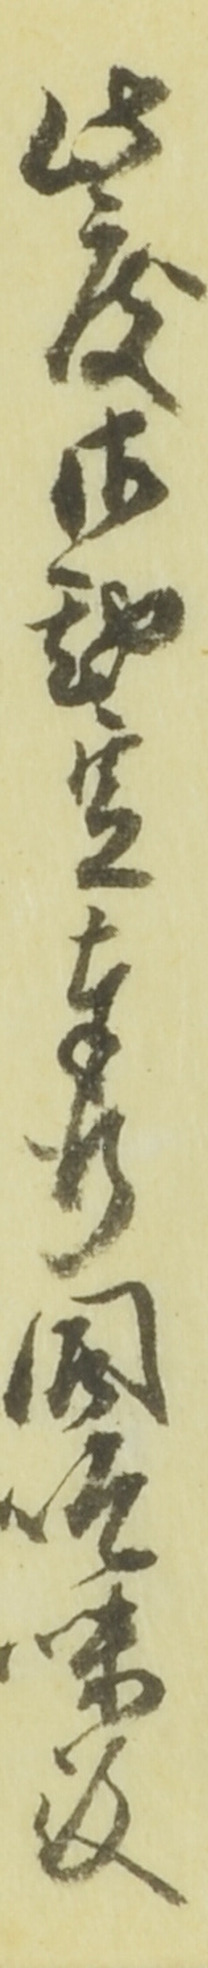此度御勘定奉行同吟味役
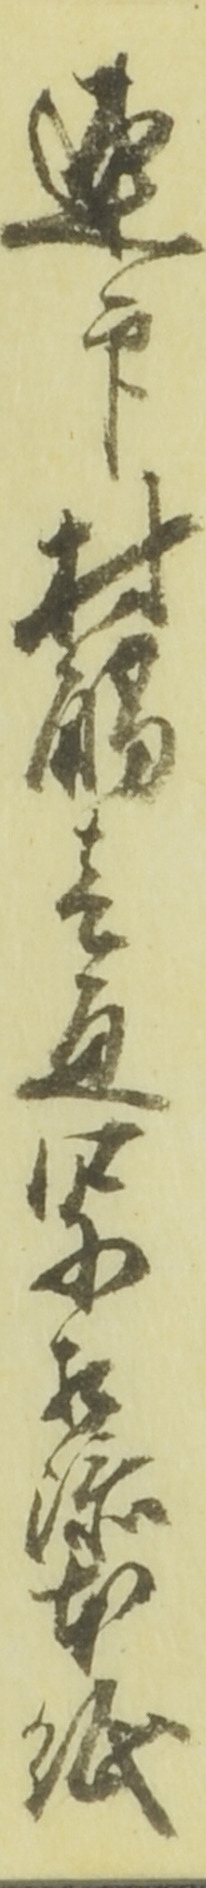連印村触壱通写相添本紙
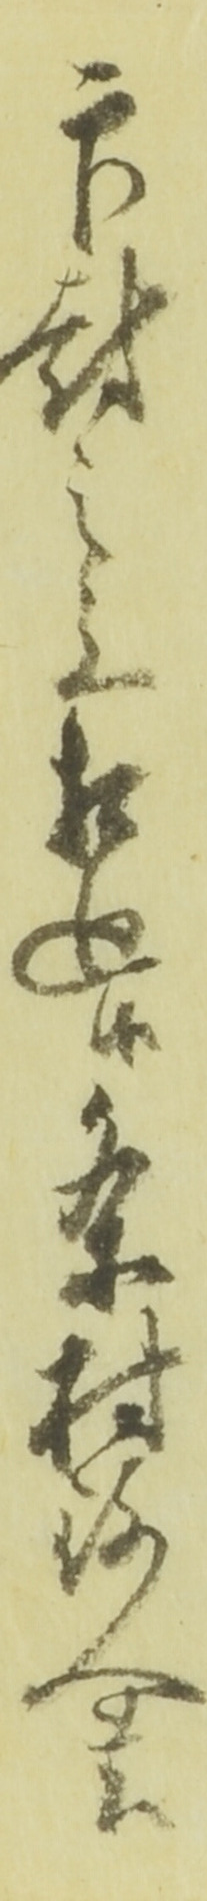印封之上相廻候条村役人共
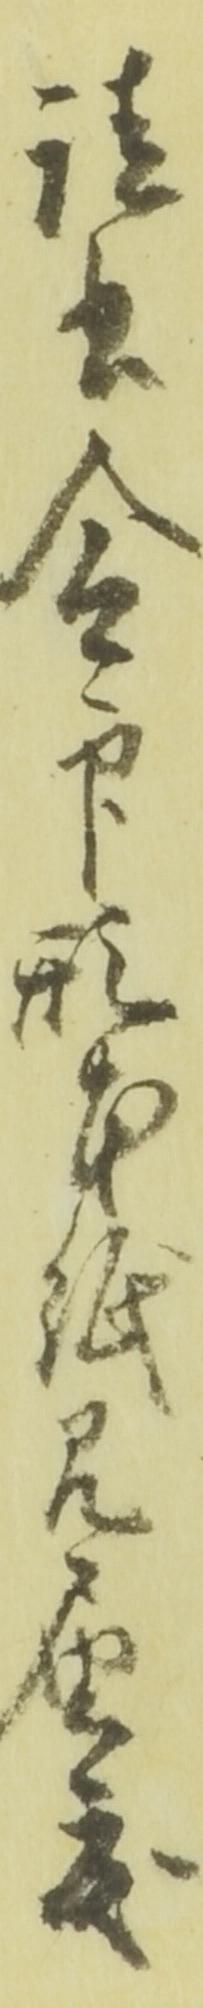請書令印形本紙見届度
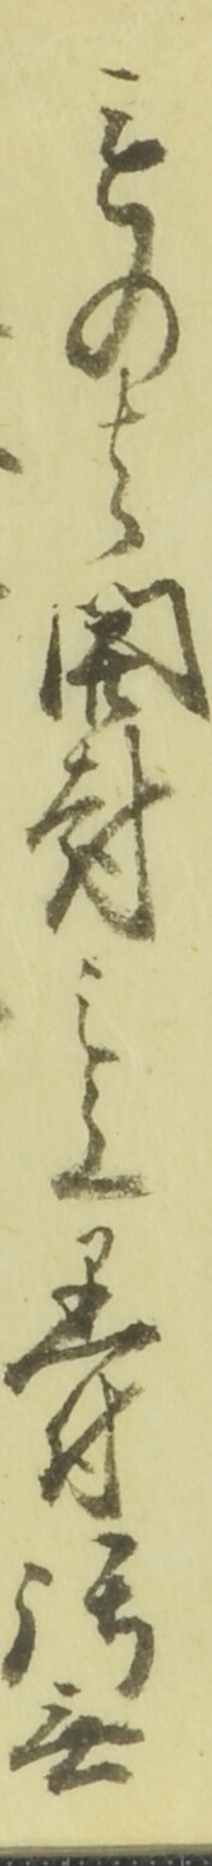ものは開封之上黒付汚無
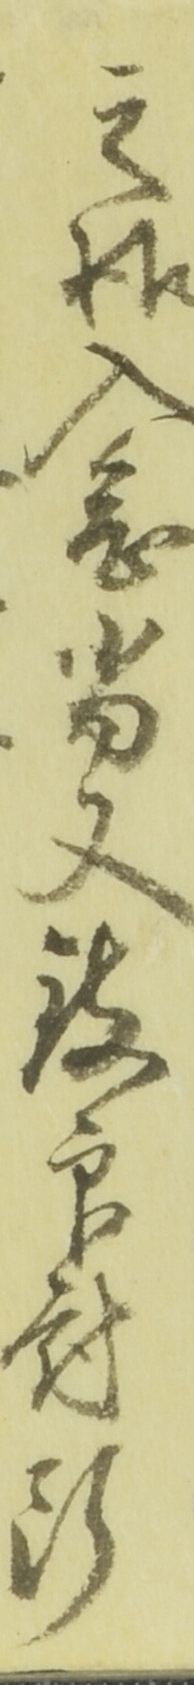之様入念尚又致印封断
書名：御触書御書附控
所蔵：伊那市立高遠町図書館・合同会社AMANE
